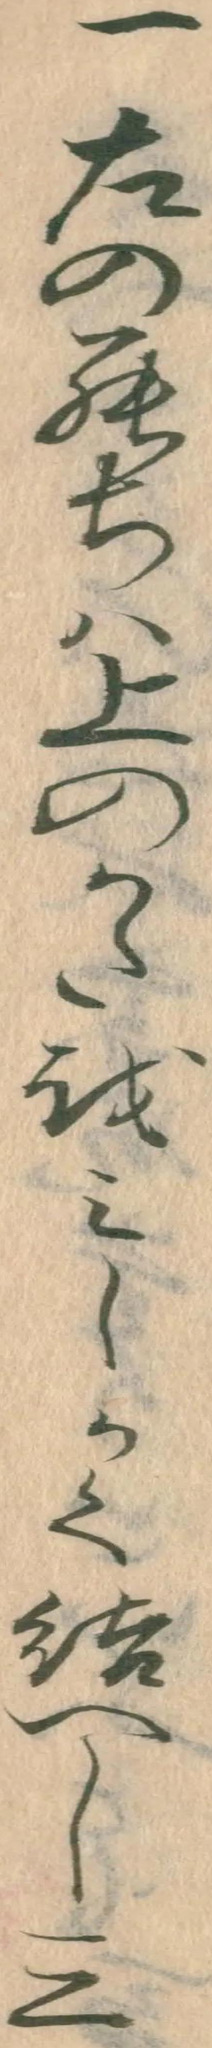一左のらちは上のかたをみしかく結へし三
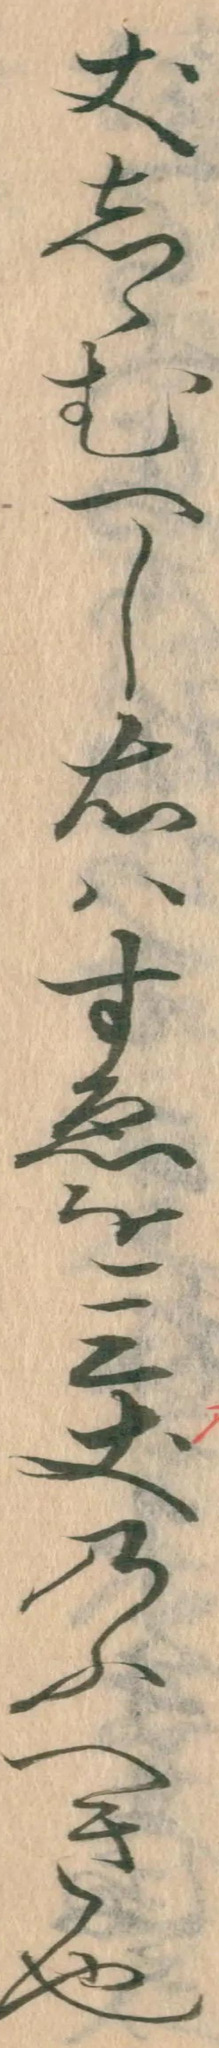丈しゝむへし右はすゑを三丈のふへき也
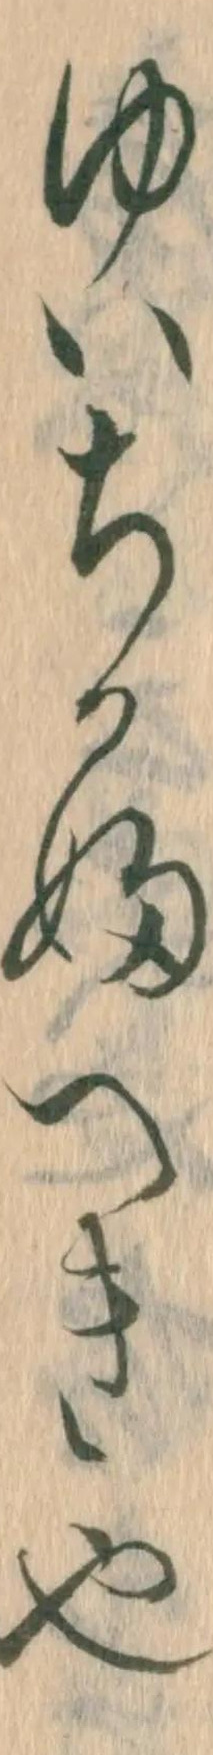ゆいちかふへき也
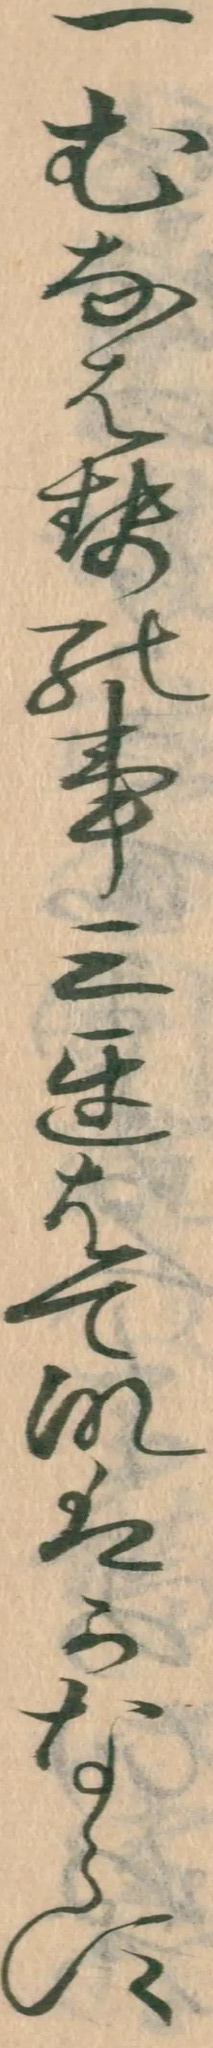一むなはせの事三遅はてなはかならす
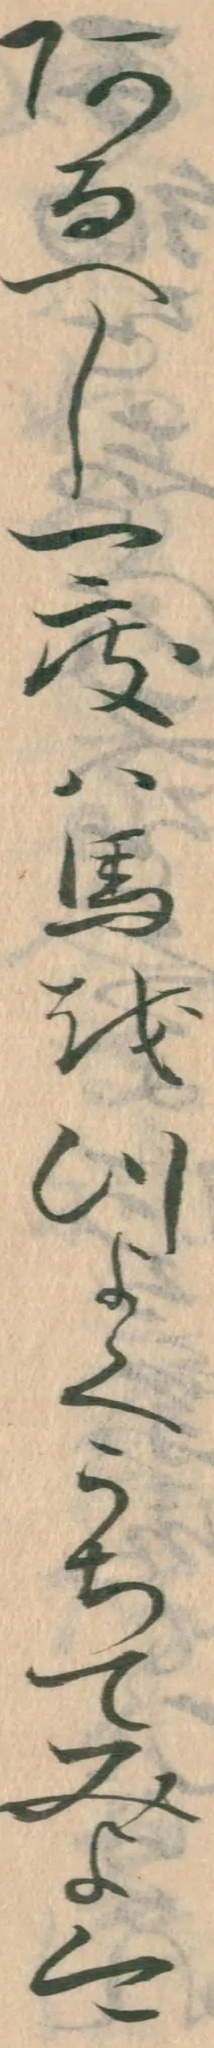あるへし一度は馬をつよくうちてみよ今
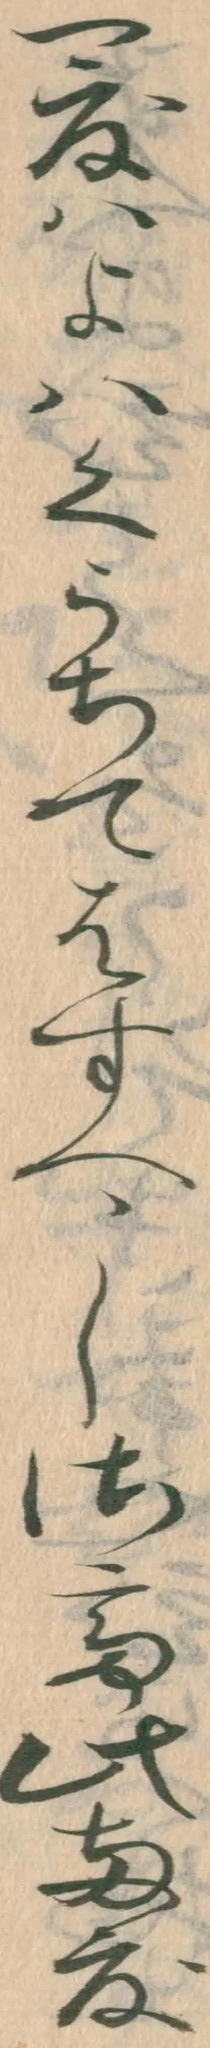一度はよはくうちてはすへしさて此両度
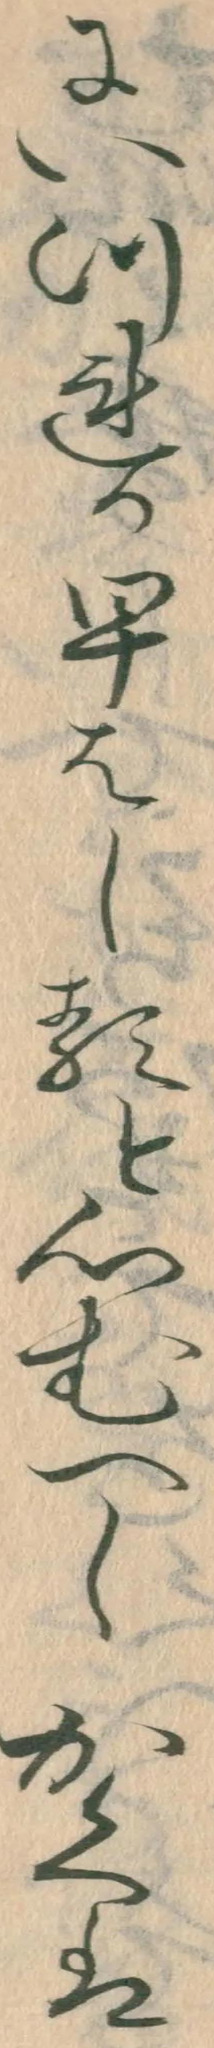にいつれか早はしると心むへしかくは
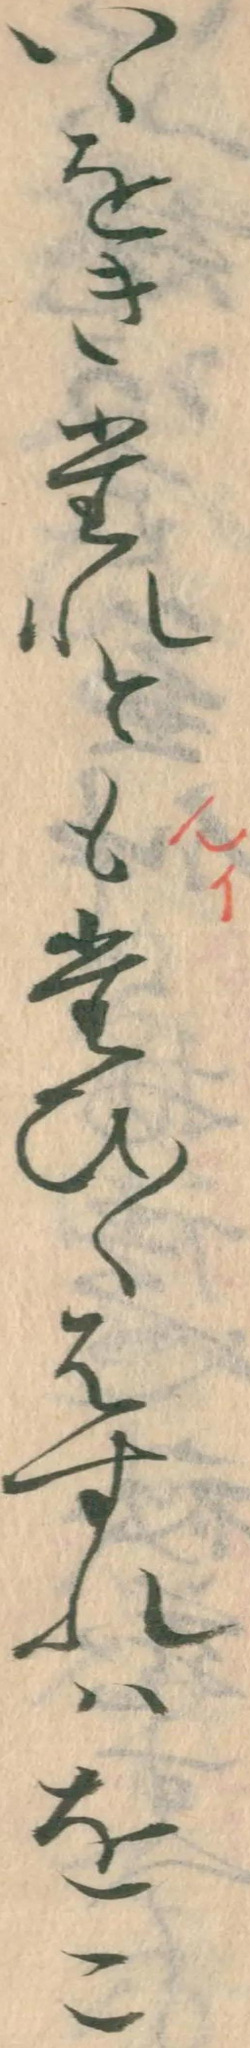いゝをきたれともたひ〳〵はすれはをこ
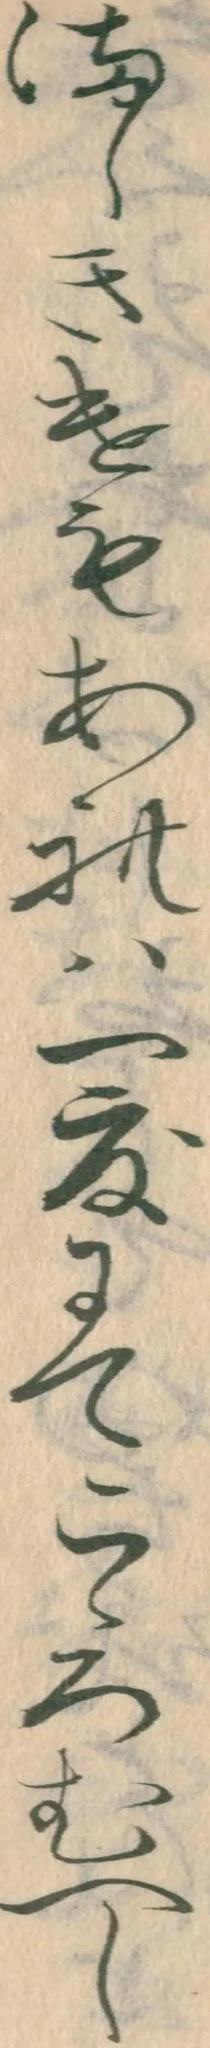ましきけもあれは一度にてこゝろむへし
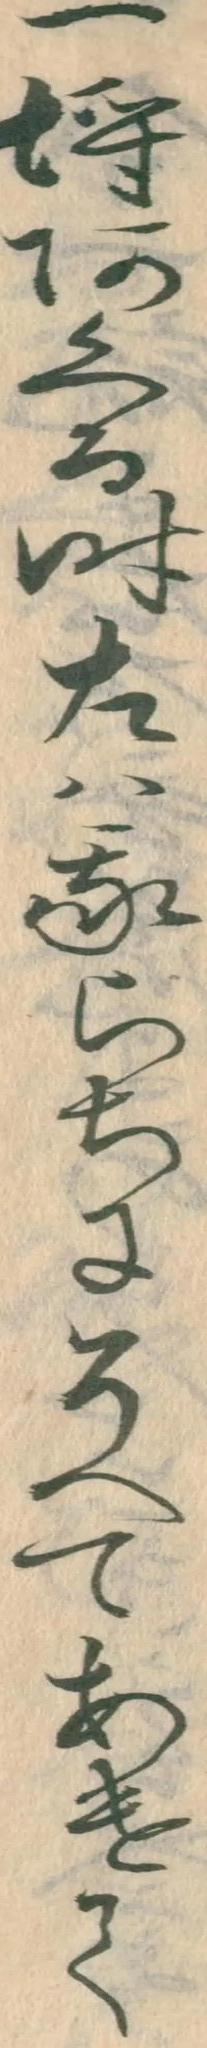一埒あくる時左は我らちにそへてあけて
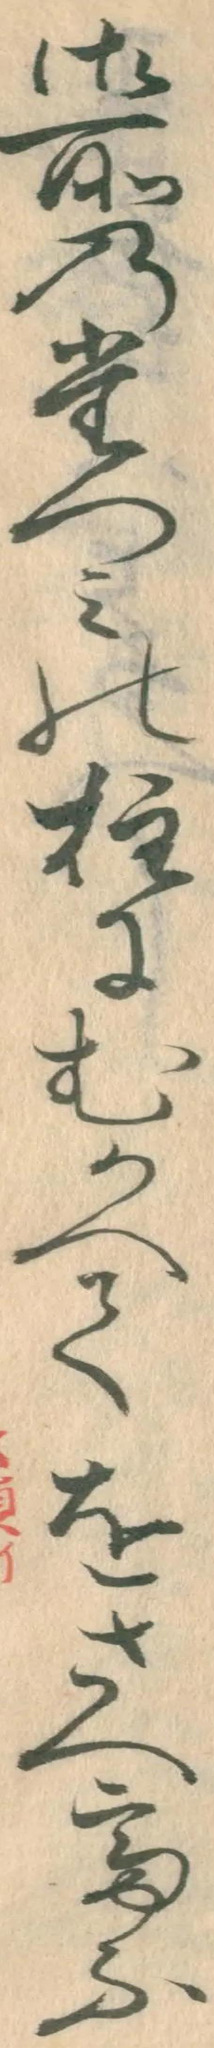御所のたつみの柱にむかへてをさへてふ
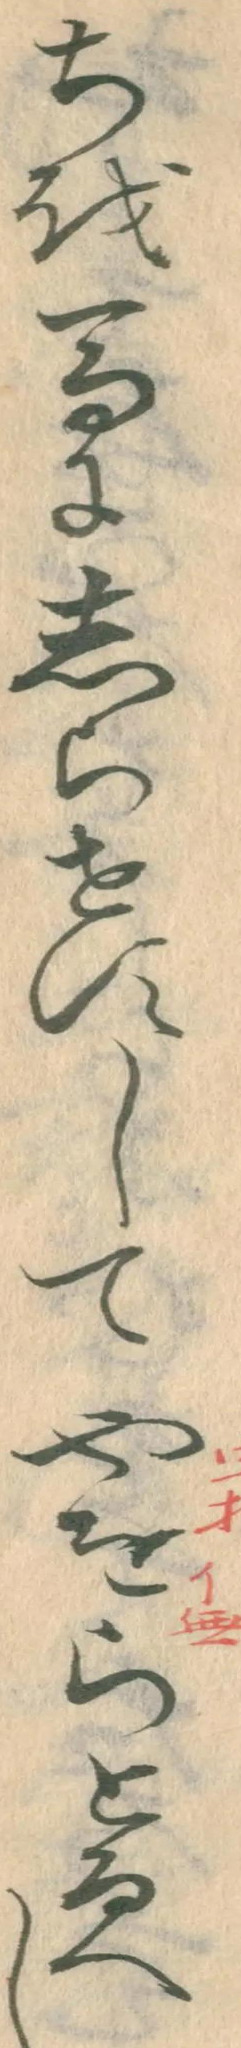ちを馬にしらせすしてやをらとるへし
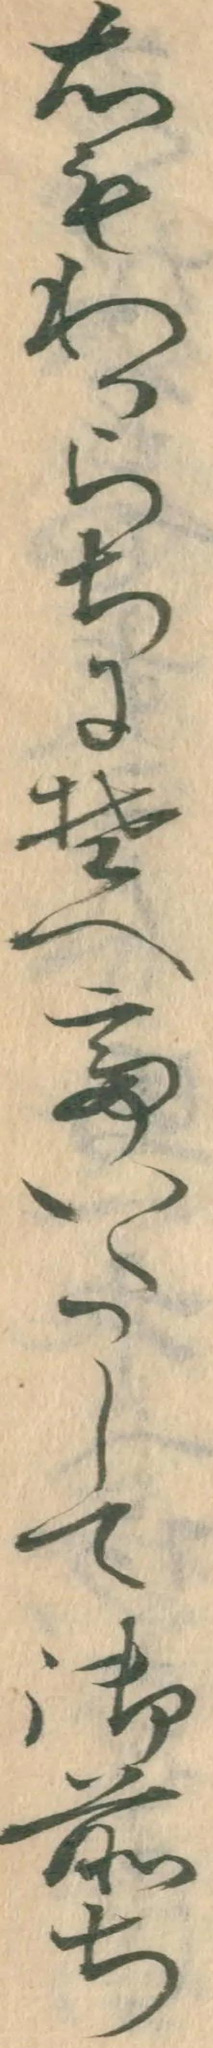右もわからちにそへていたして御前ち

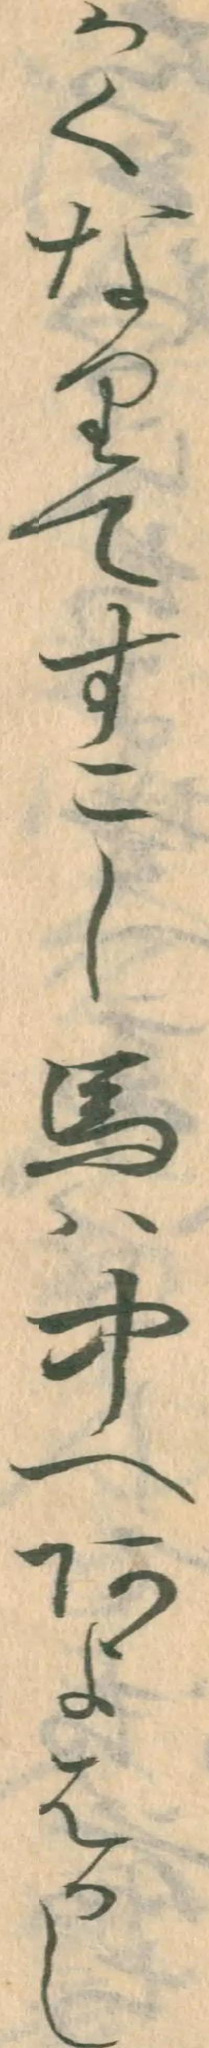かくなりてすこし馬は中へあよはかし
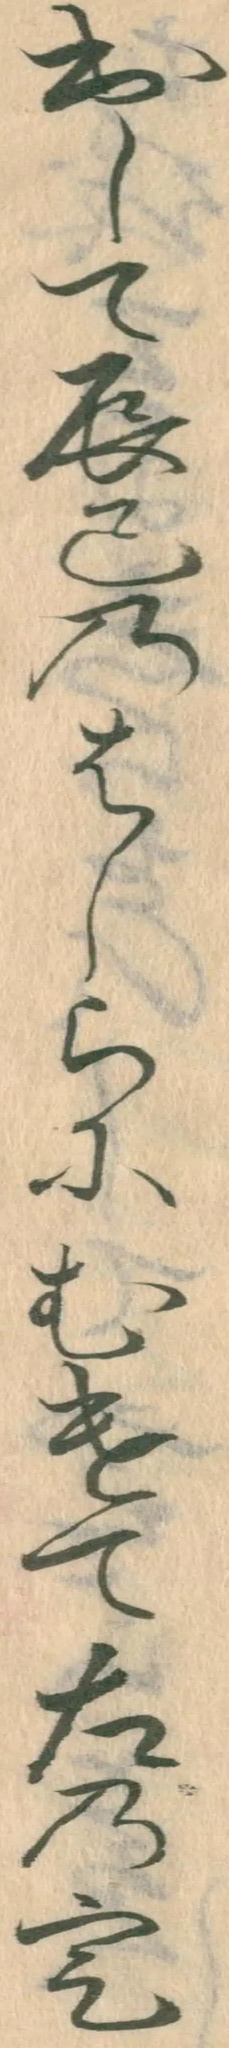出して辰巳のはしらにむけて左の定
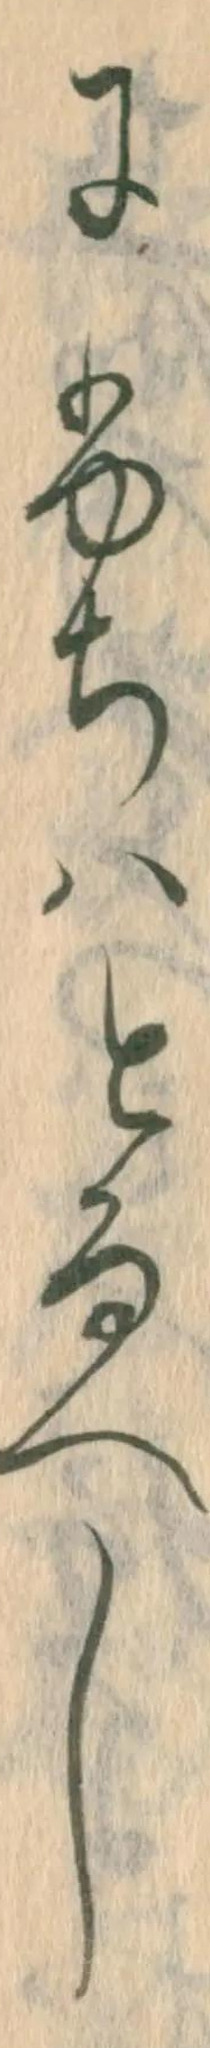にふちはとるへし
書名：賀茂社記録. 第13冊
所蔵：国立国会図書館 National Diet Library, JAPAN
